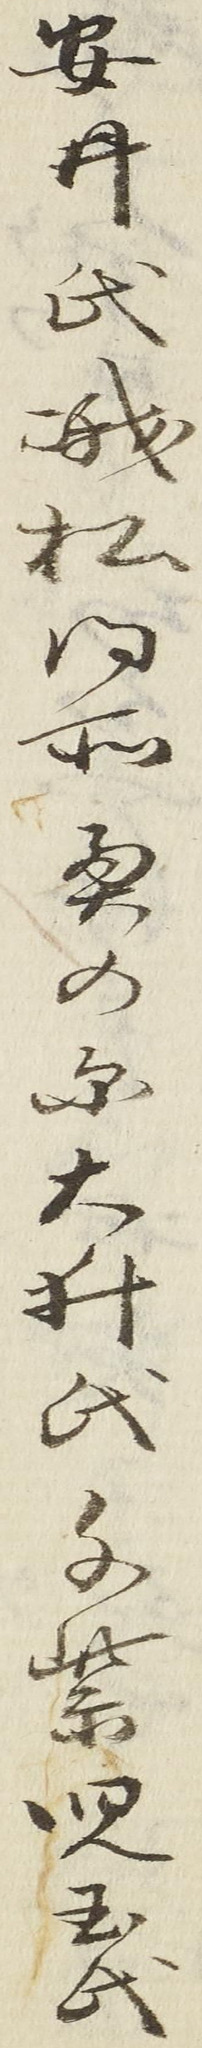安井氏峨松同所奥の原大井氏千紫児玉氏
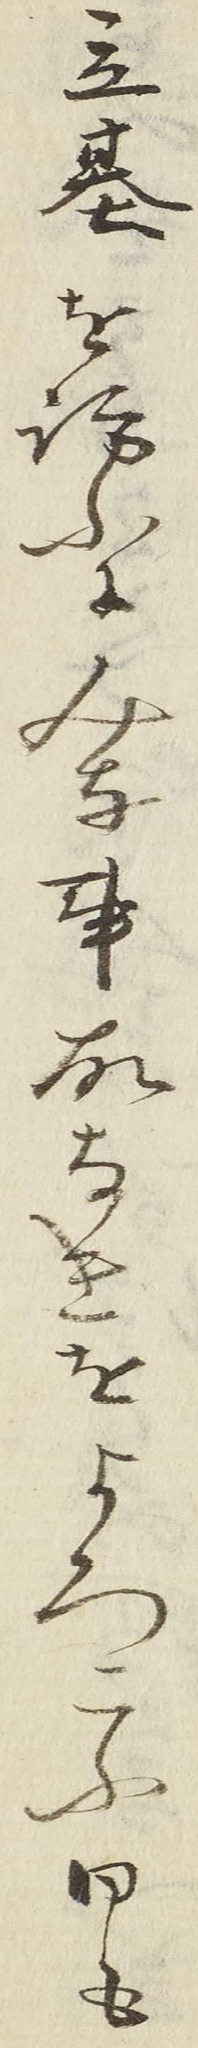立基を訪ふにみな事故なきをよろこふ日も
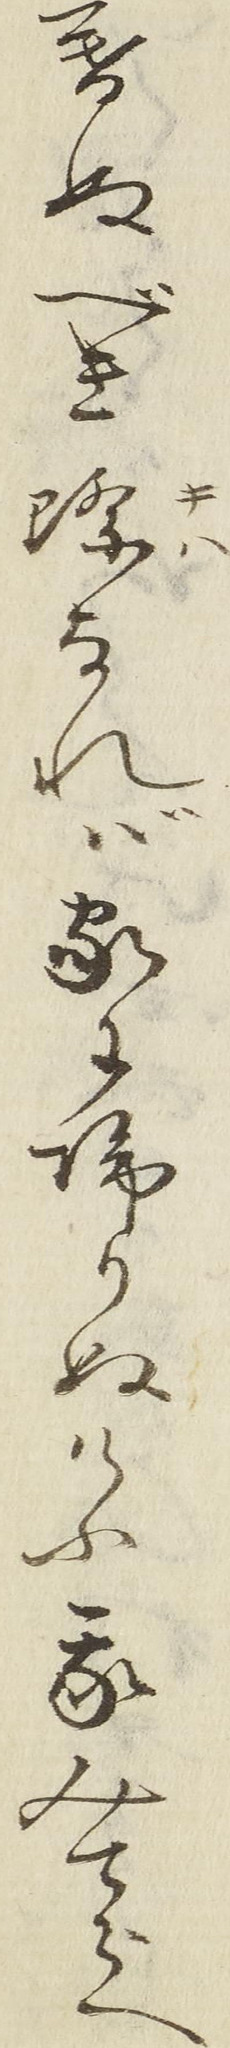暮ぬべき際なれば家に帰りぬけふ我みてらへ

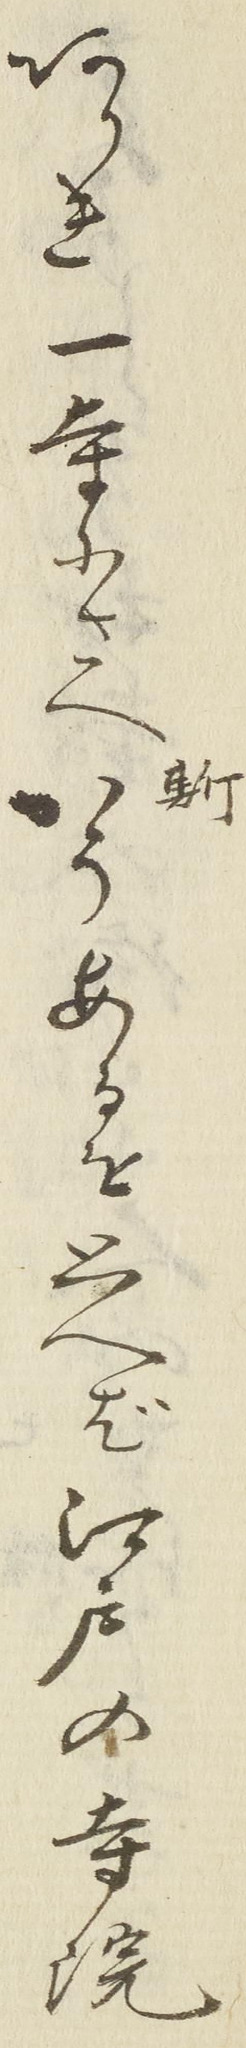ありき一寺にさへかう斯あるをとへば江戸の寺院
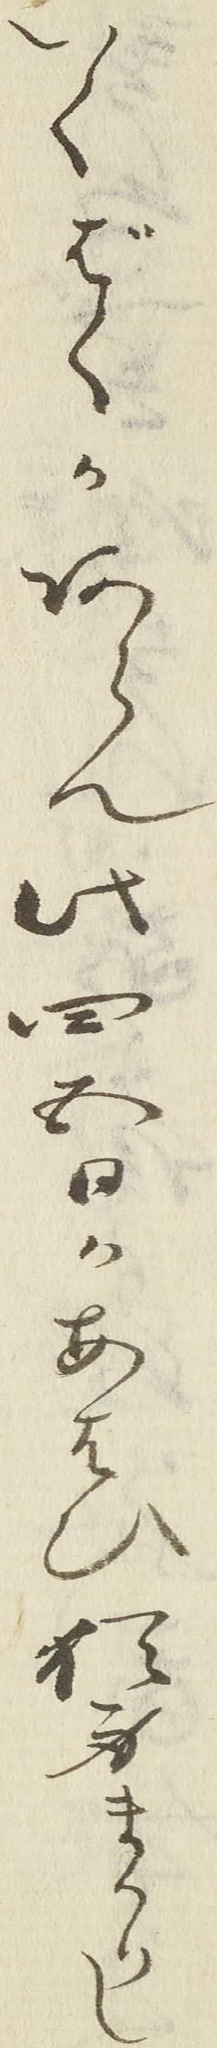いくばくかあらん此四五日かあはひ猶身まかりし
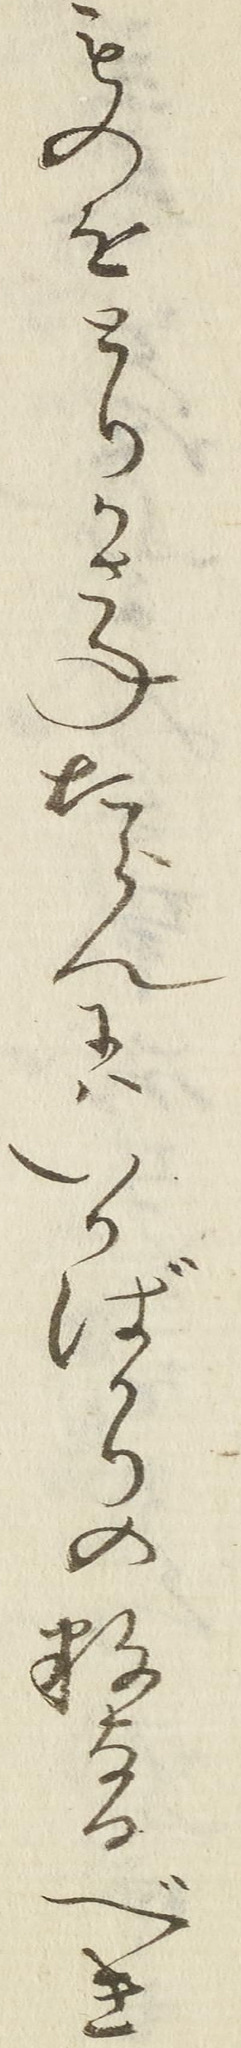ものをとりかさねたらんにはいかばかりの数なるべき
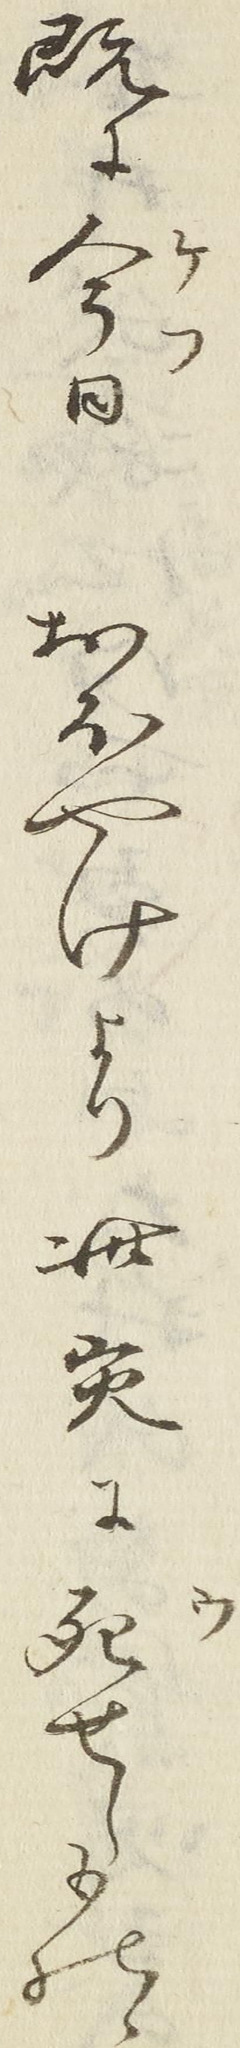既に今日おほやけより此災に死せしものゝ
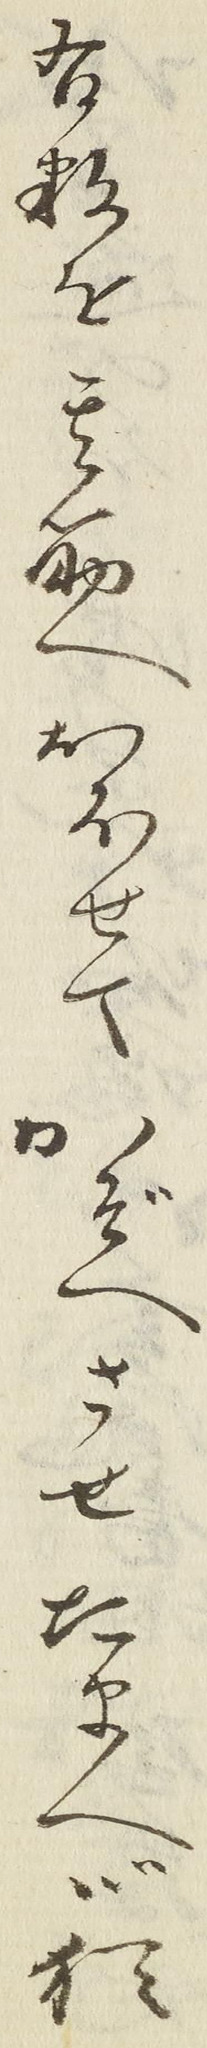有数を其筋へおほせてかぞへさせたまへば猶
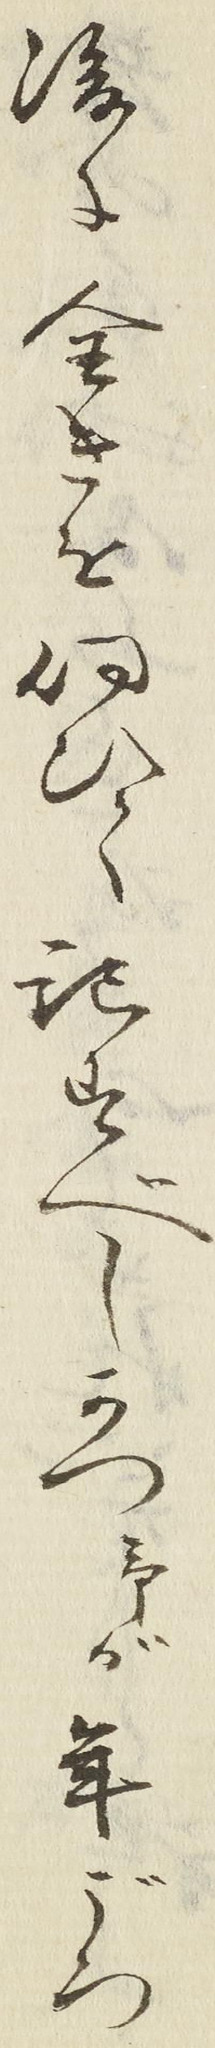後に全きを伺ひて記すべしかつ予が年ごろ
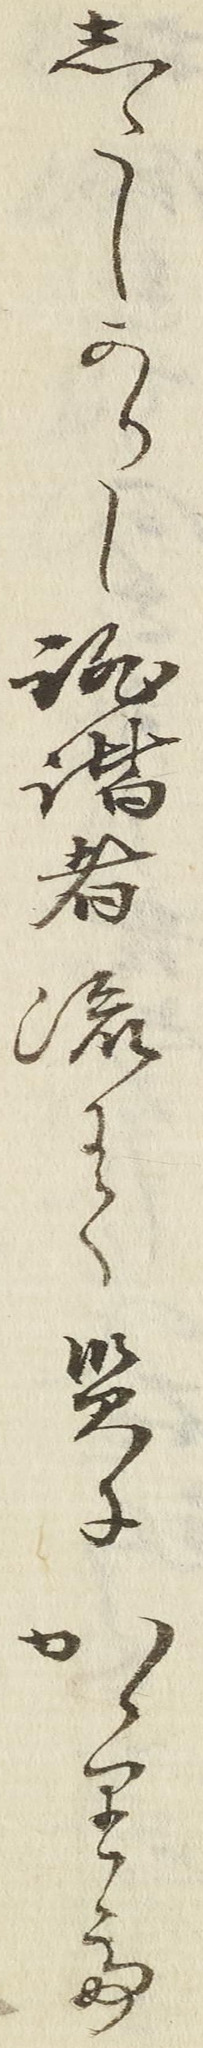したしかりし誹諧者流にて災にかゝりて
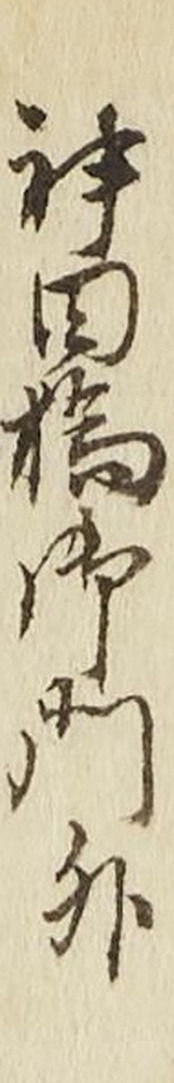神田橋御門外
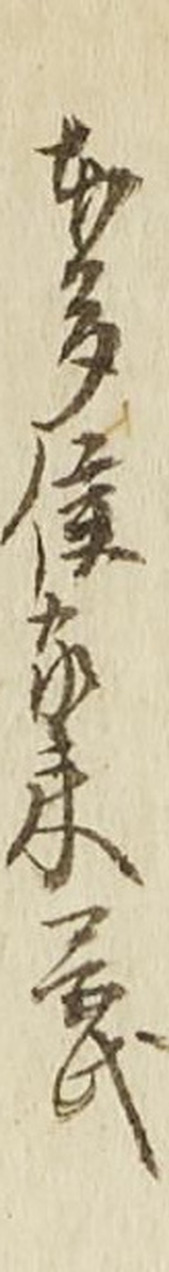本多侯家来岡氏
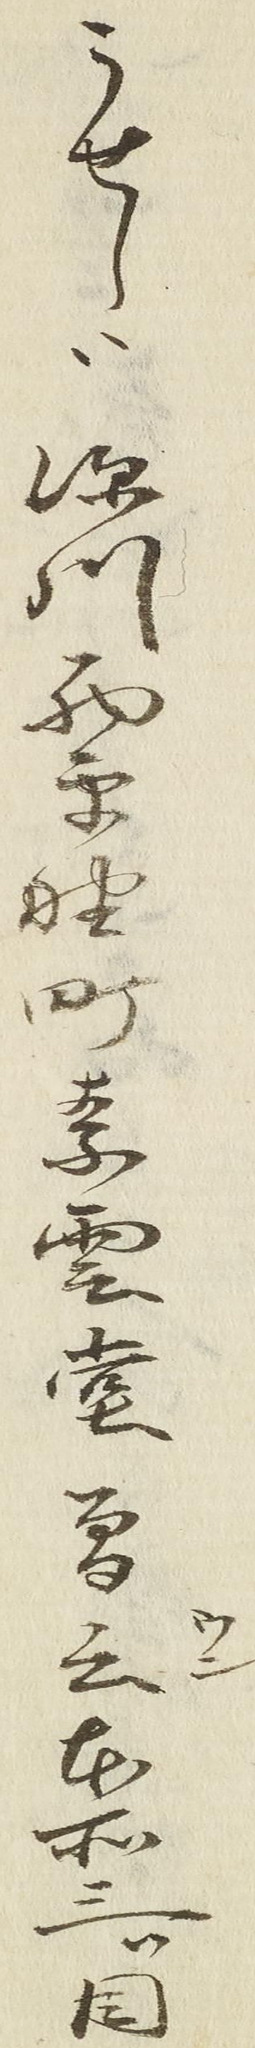うせしは深川西平野町素雲堂曽云本所三ツ目
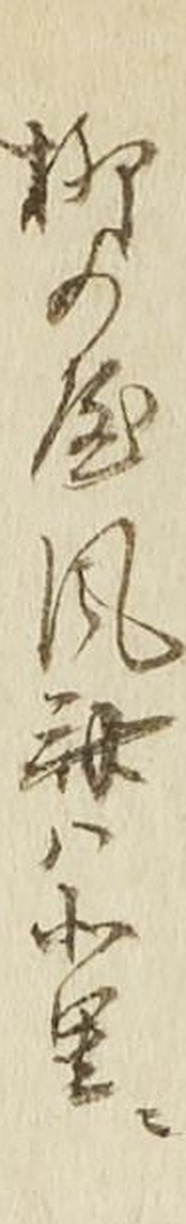柳の屋風斎は北里に
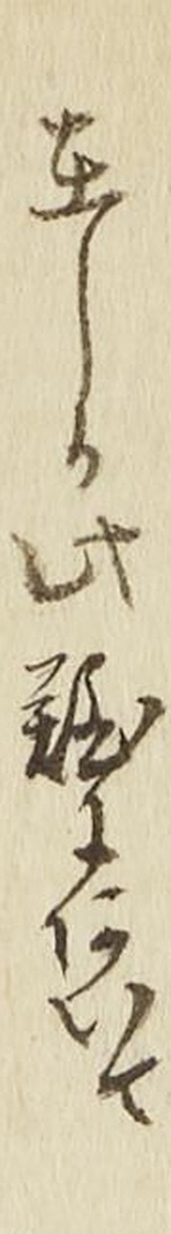在しか此難にあいて
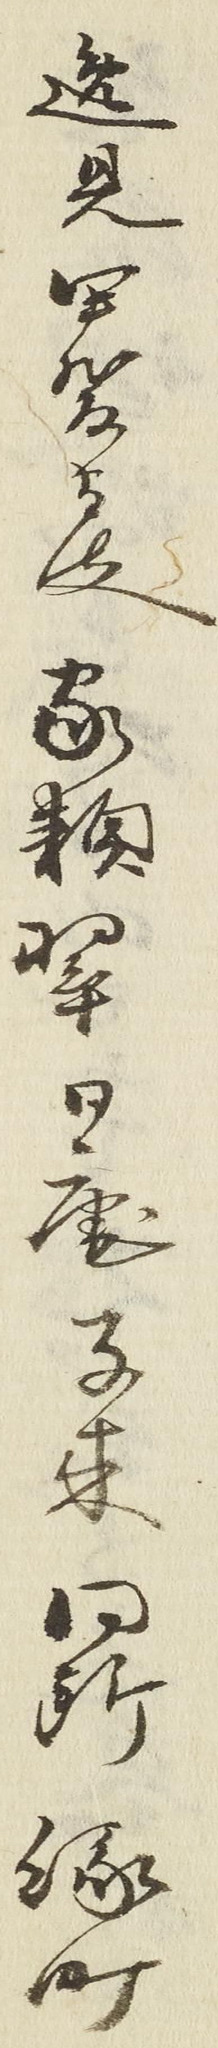逸見甲斐守殿家類翠日庵子来同所緑町
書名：やぶれ窓の記　全
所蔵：東京大学地震研究所図書室 Earthquake Research Institute Library, The University of Tokyo, JAPAN
